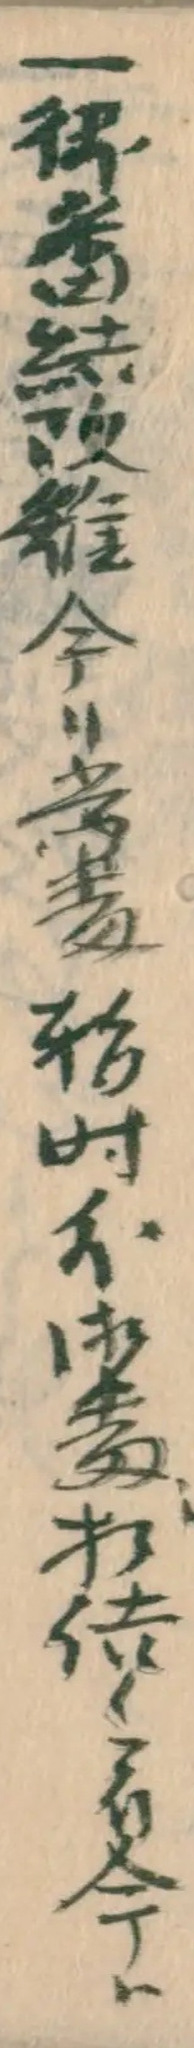一御番結改雖今日当番暫時外御番相詰候ニ付今日
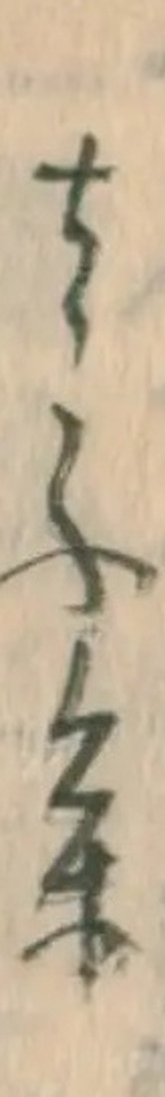は不参
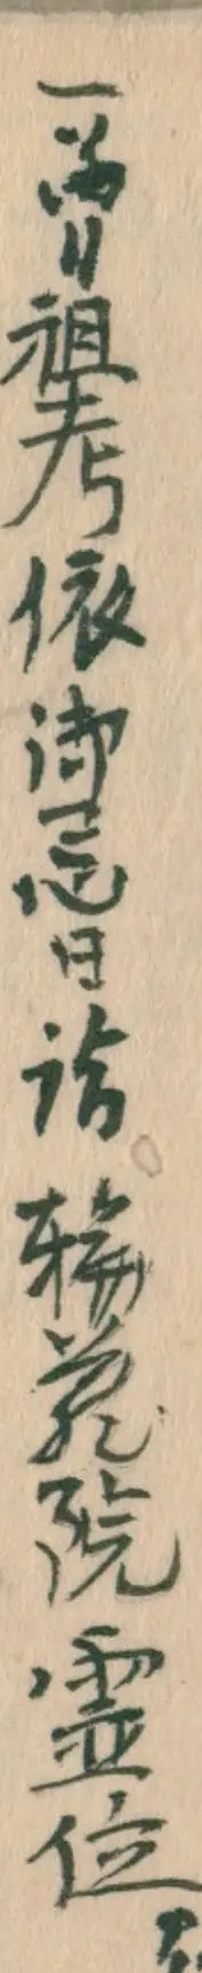一曾祖考依御忌日詣輪蔵院霊位尤焼香
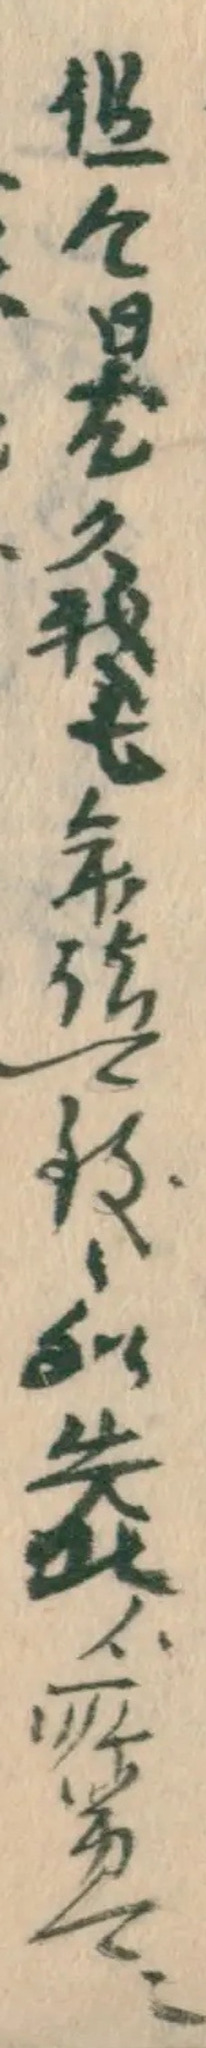但今日尤久我へも参詣可致候処先頃ゟ所労今ニ
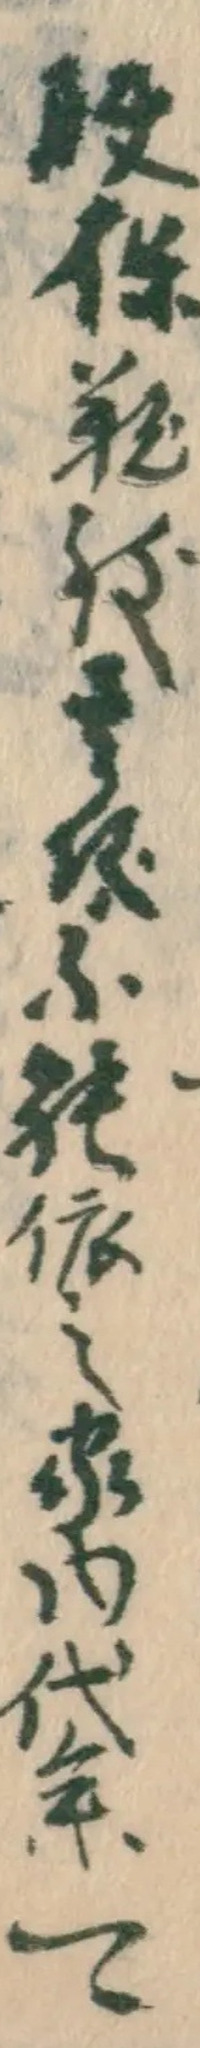使保難致其儀不能依之家内代参可
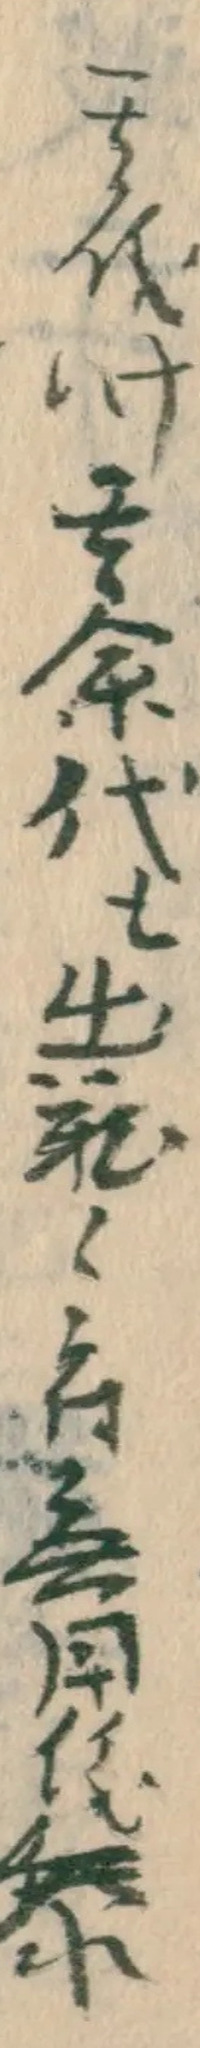其儀叶其余代も出難候ニ付無用儀参
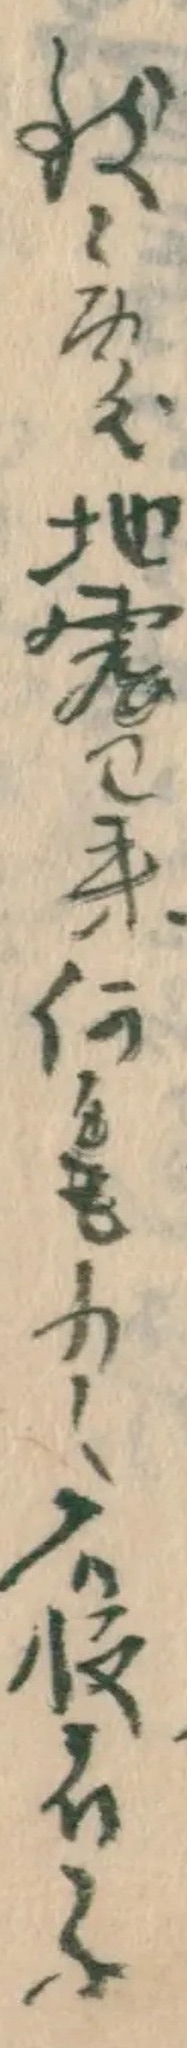致候処地震已来何れも少々不快ニ付不
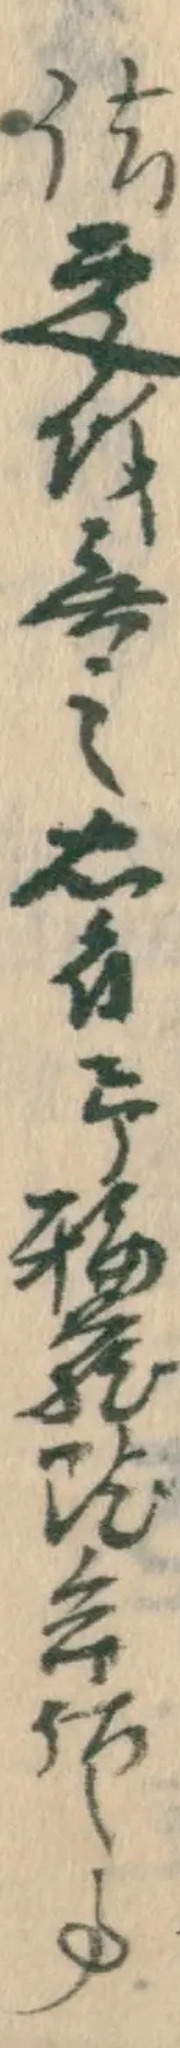詣之儀無之右ニ付予輪蔵院参詣之事
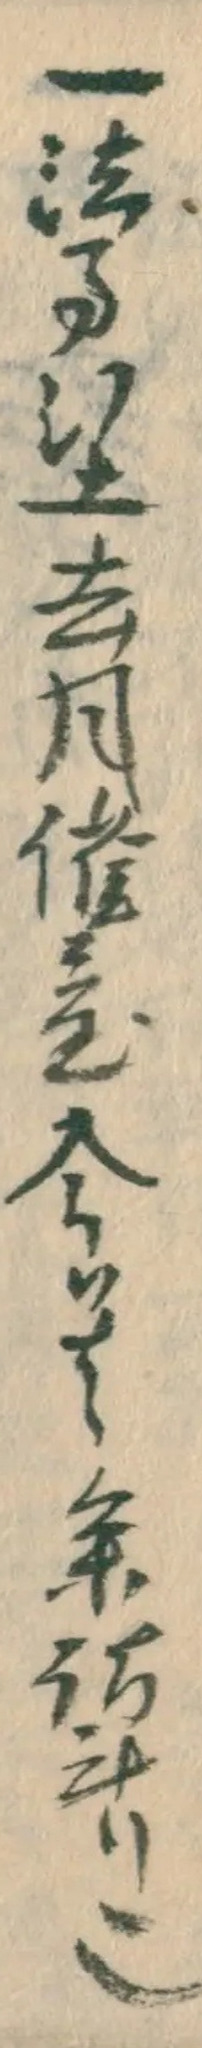一法事引上去月催置今日は参詣計り也
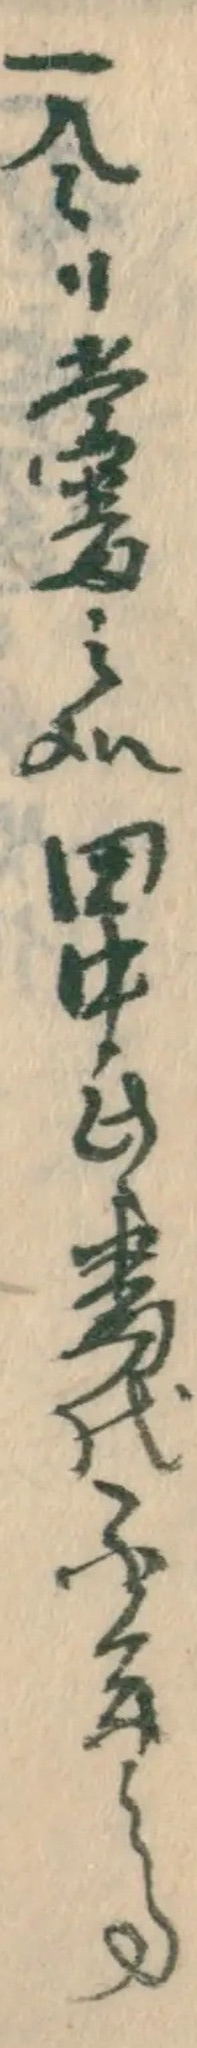一今日当番之処田中氏番代不参之事

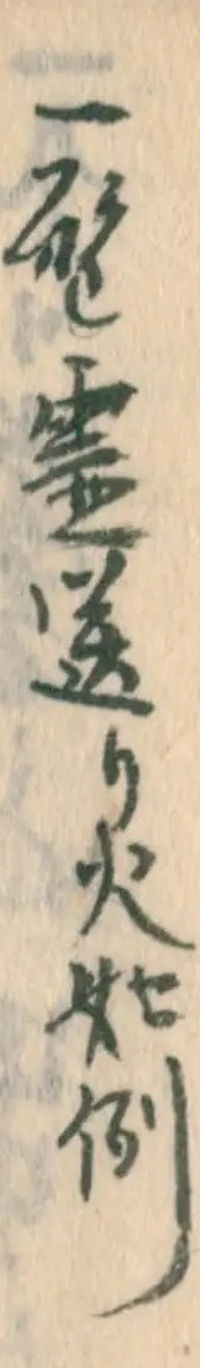一聖霊送り火如例
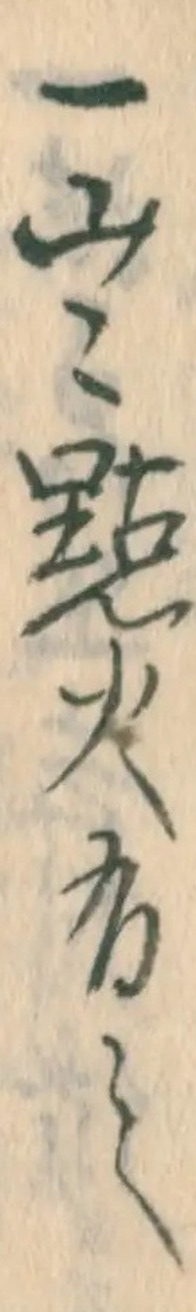一山々点火有之
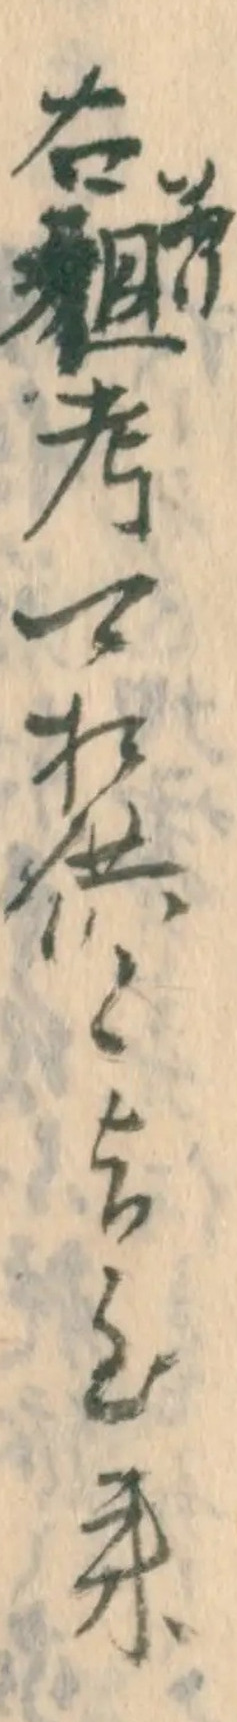右曾祖考可相供候旨到来
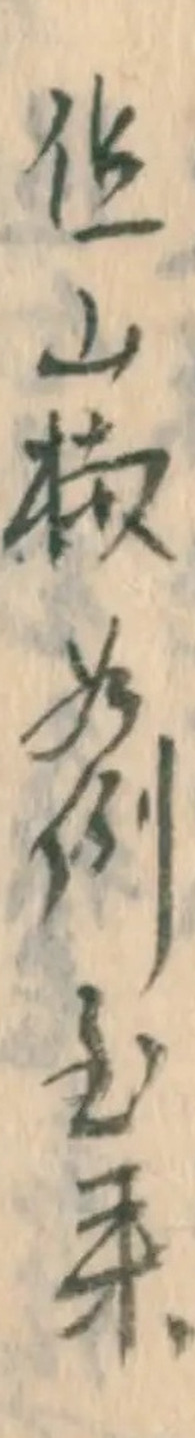但山椒如例到来
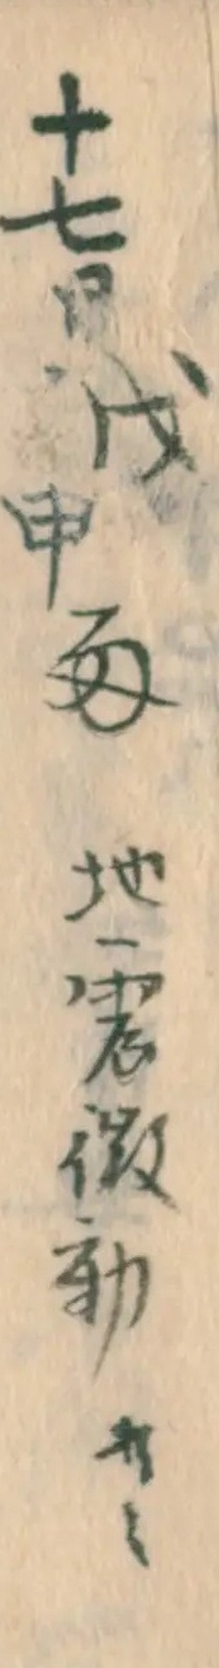十七日戊申雨地震微動折々
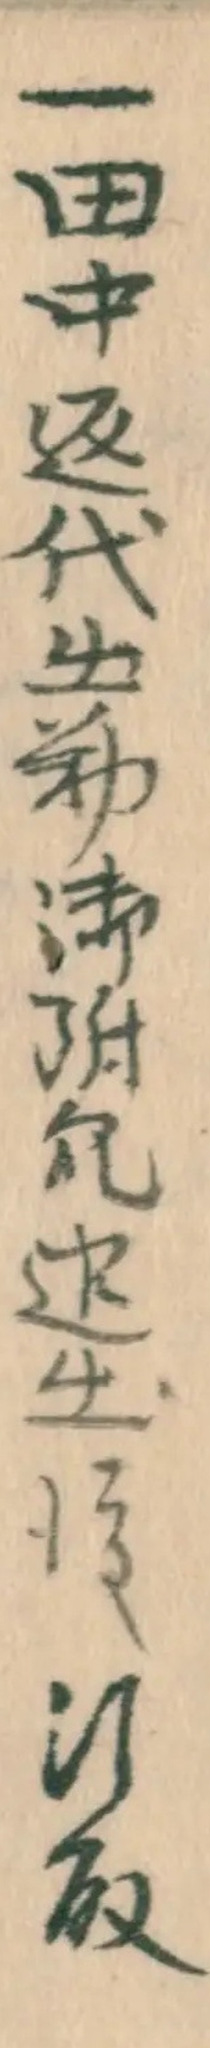一田中返代出勤御附衆退出後引取
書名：禁裏御所御用日記. [131]
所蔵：国立国会図書館 National Diet Library, JAPAN
